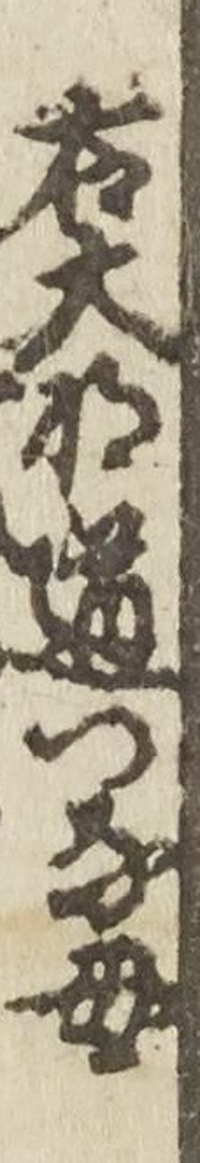右大将道つな母
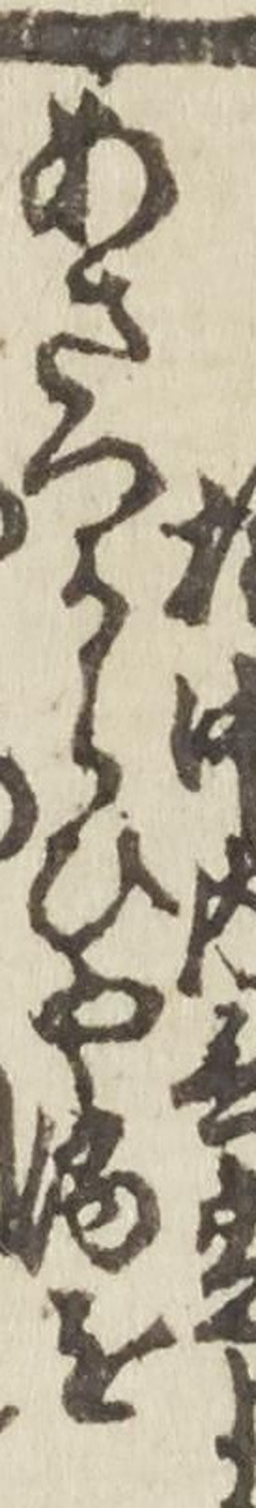あさつからひや酒を
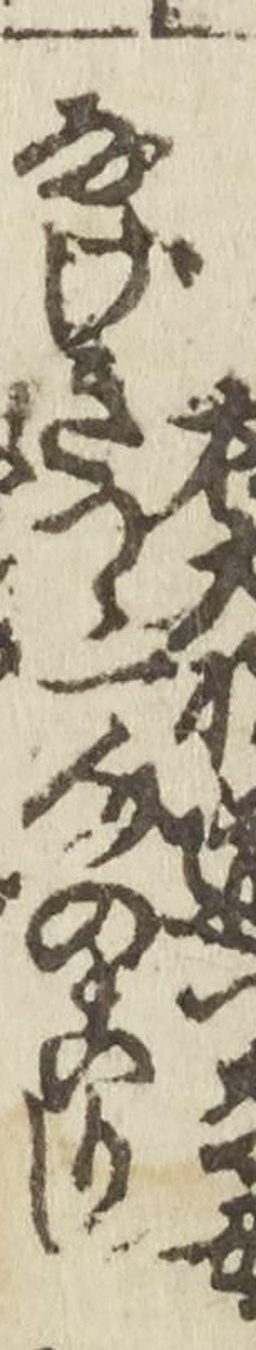嘆きつゝ一人のこりし
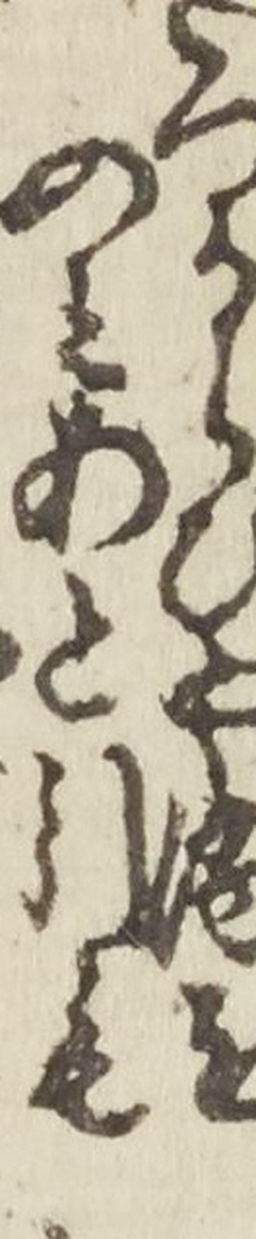のみあと引も
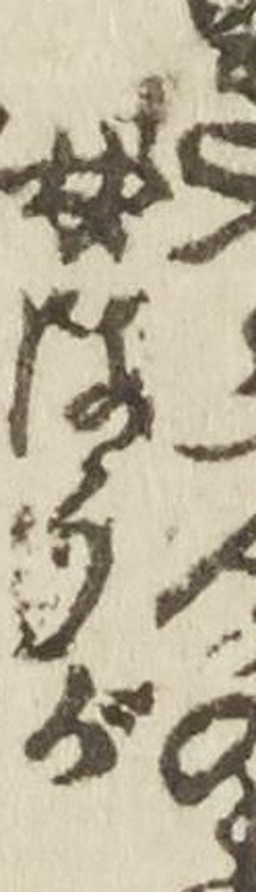女ほうが
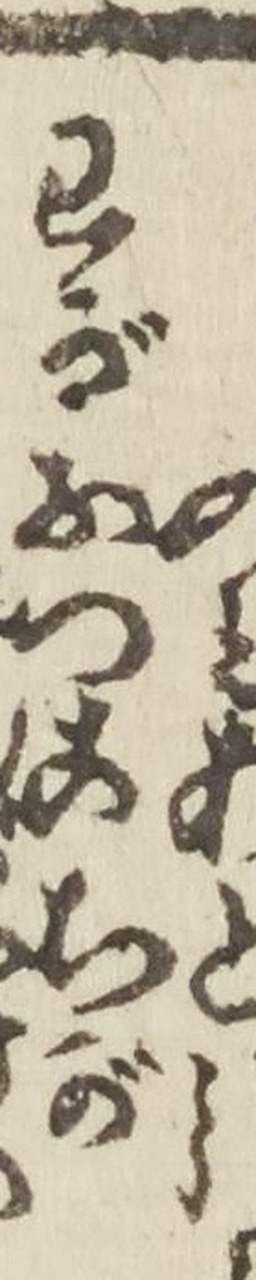わがおつこちが
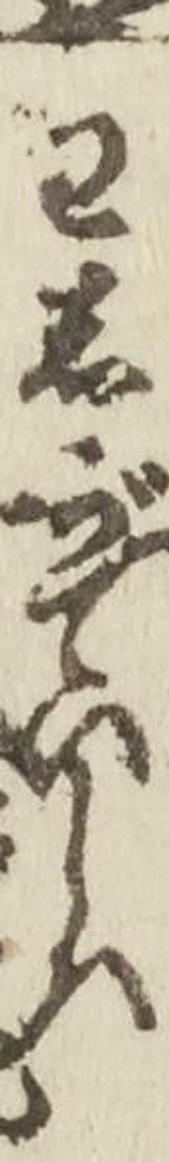わしがていし
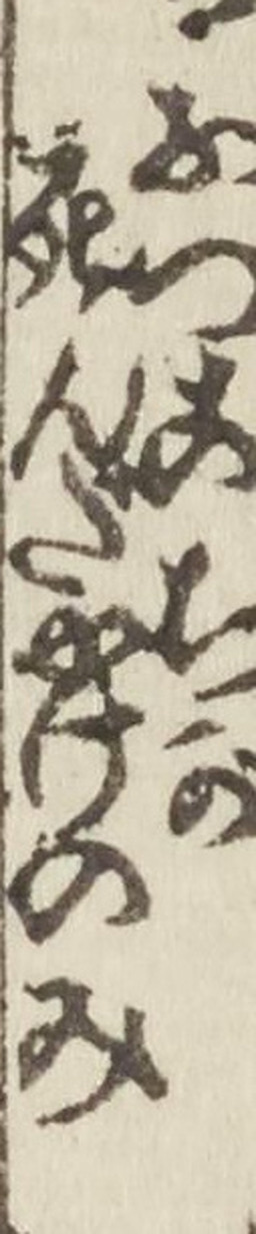死んだやけのみ
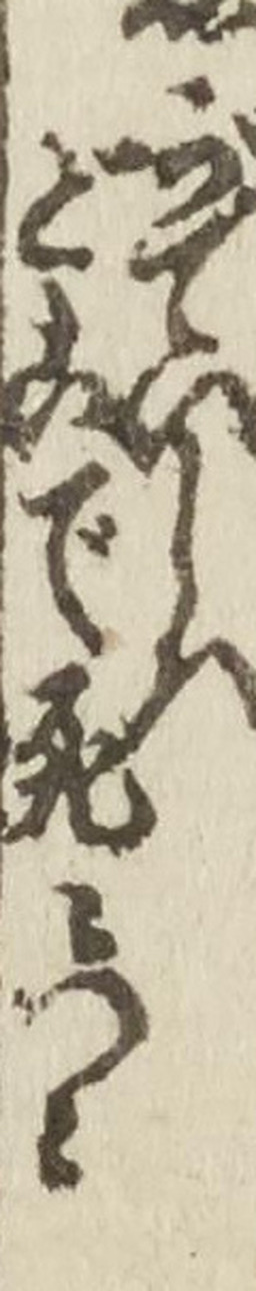どこで死につゝ
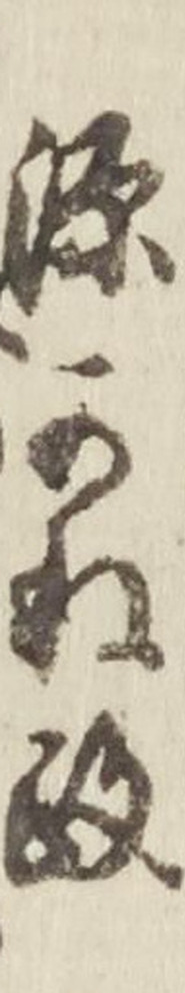源かね政
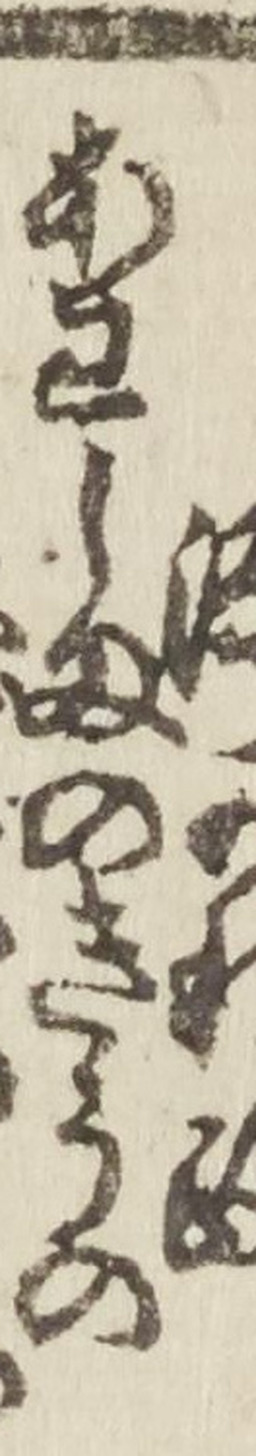あわしまのきうの
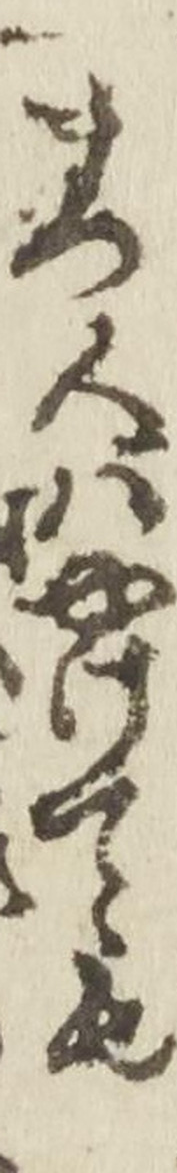まつ人はやけても
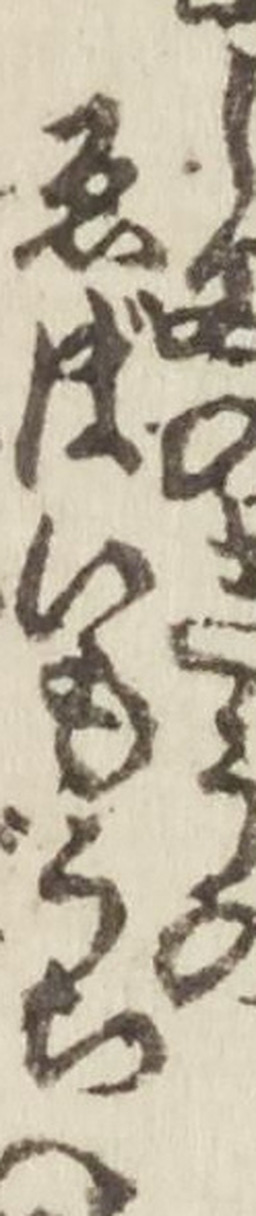ゑぼいもうち
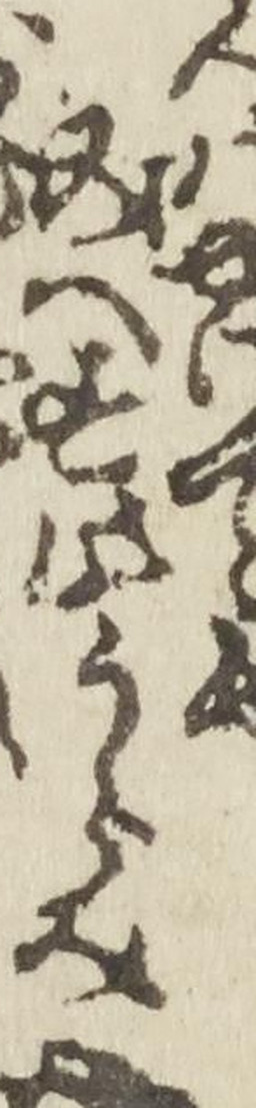みへす此うらみ
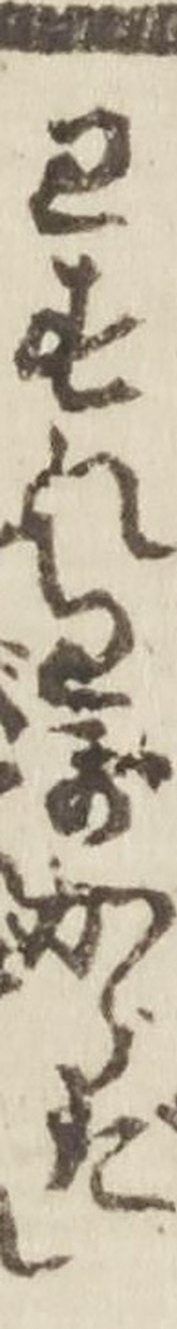わすれわがからだ
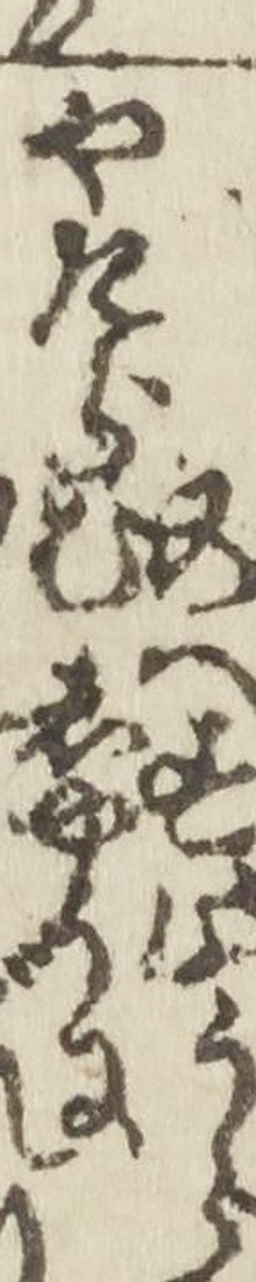やたらむすやうに
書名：しんぱん三十六哥仙
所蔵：東京大学地震研究所図書室 Earthquake Research Institute Library, The University of Tokyo, JAPAN
